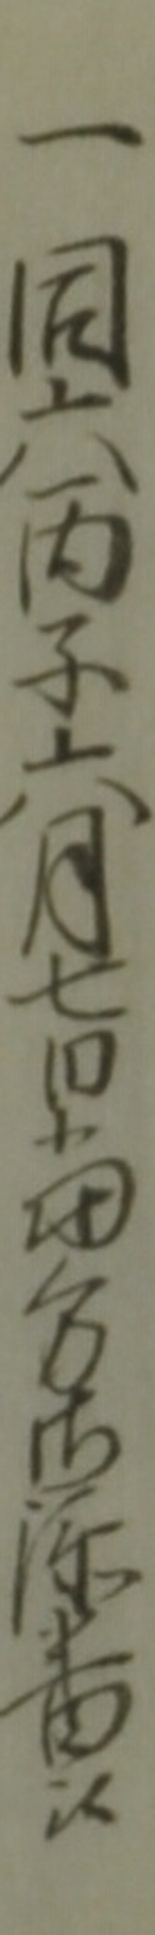一同六丙子六月七日当方御添番被
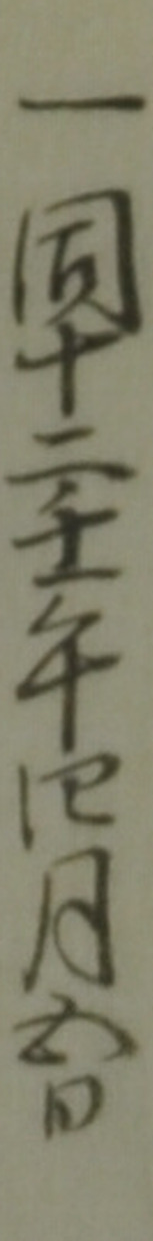一同十二壬午四月五日
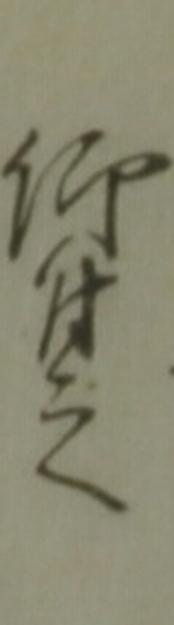仰付之
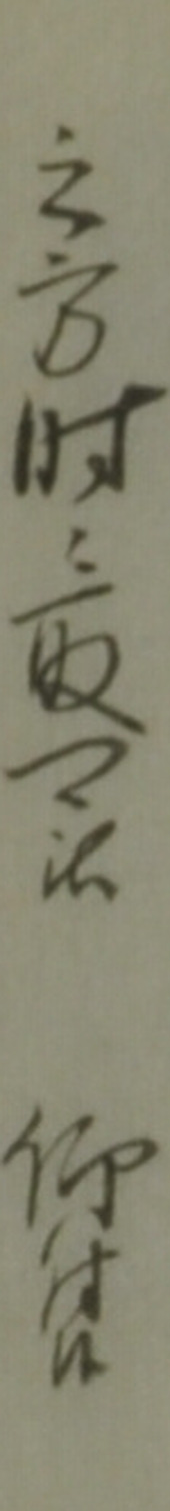之方時ニ取可被仰付候
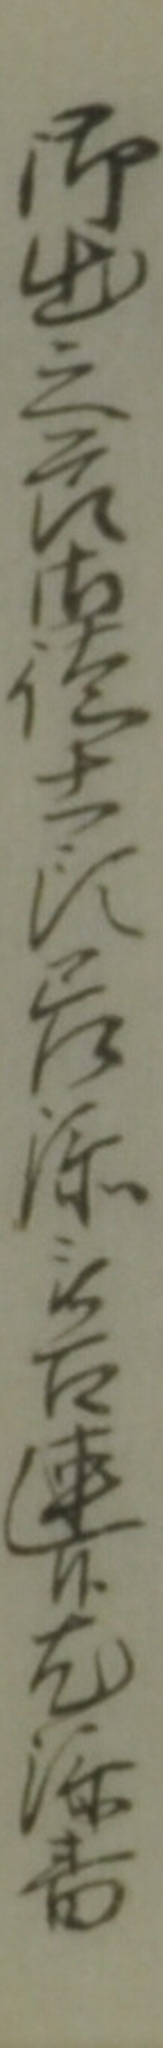御出之節御徒士頭差添被召連候尤添番
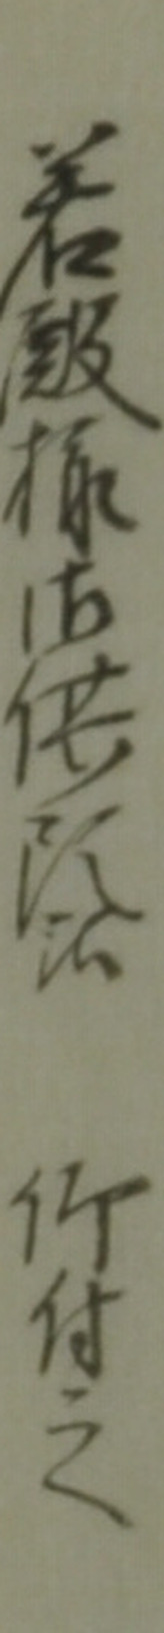若殿様御供頭被仰付之
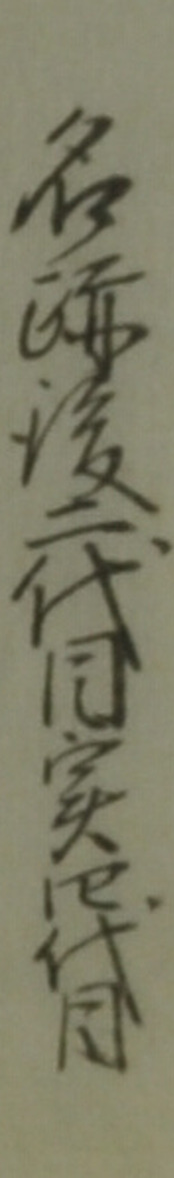名跡後二代目実四代目
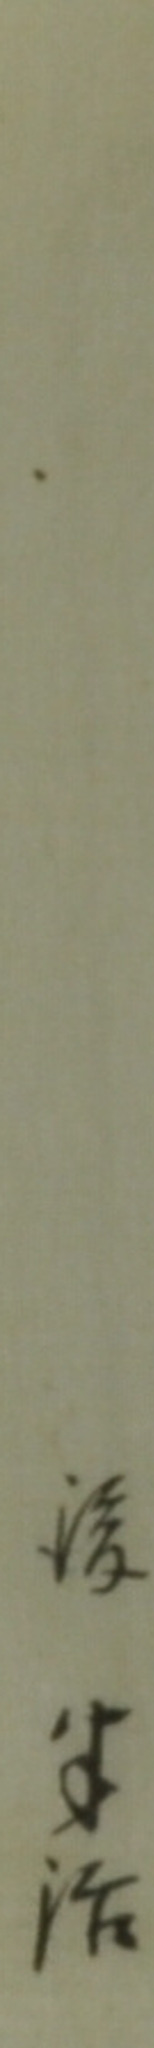後半治
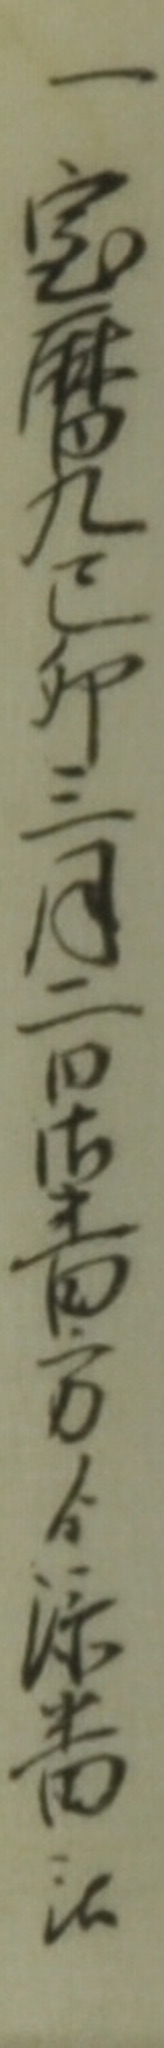一宝暦九己卯三月二日御番方より添番被
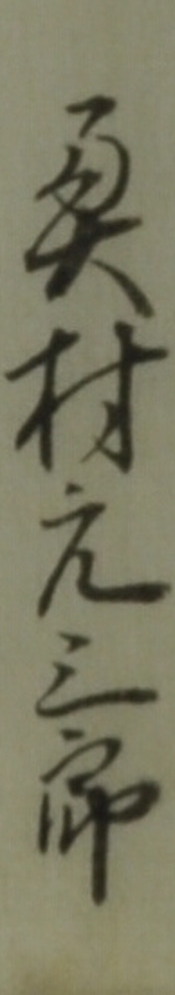奥村元三郎
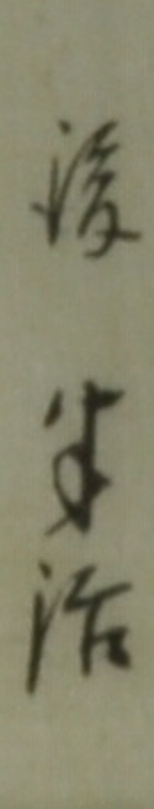後半治

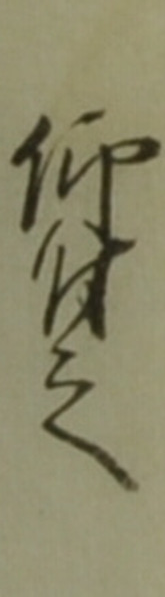仰付之
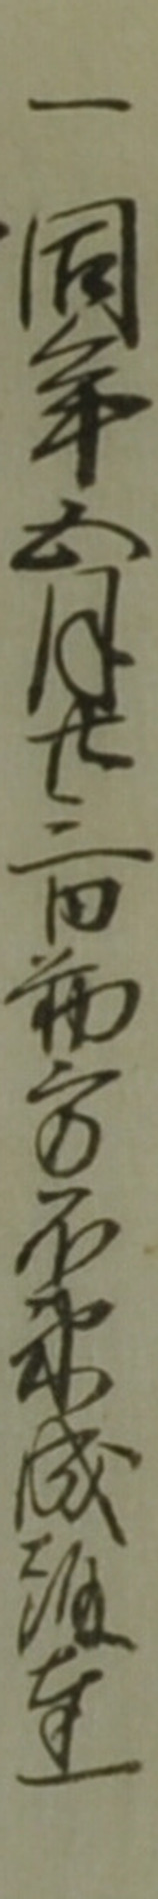一同年五月廿三日勤方不束成難報達
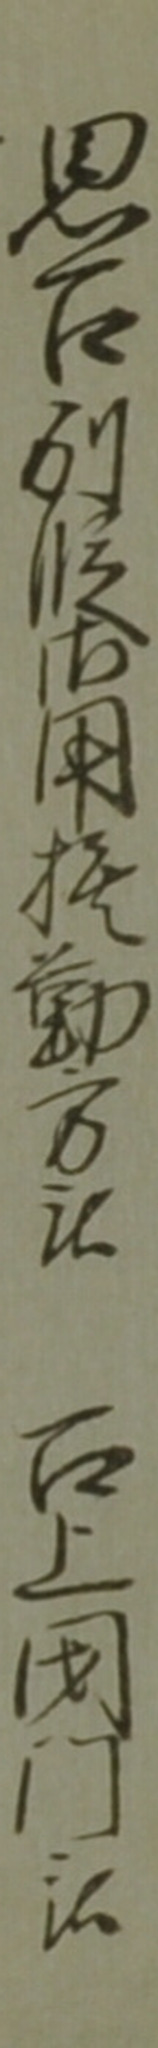思召別段御用捨勤方被召上閉門被
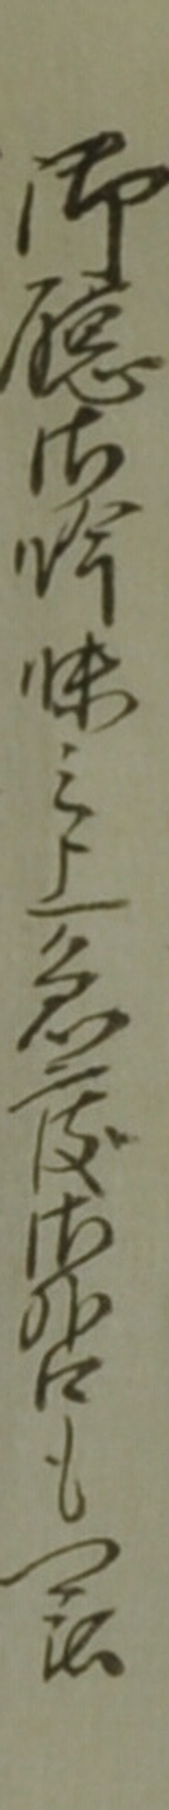御聴御吟味之上急度御咎も可被
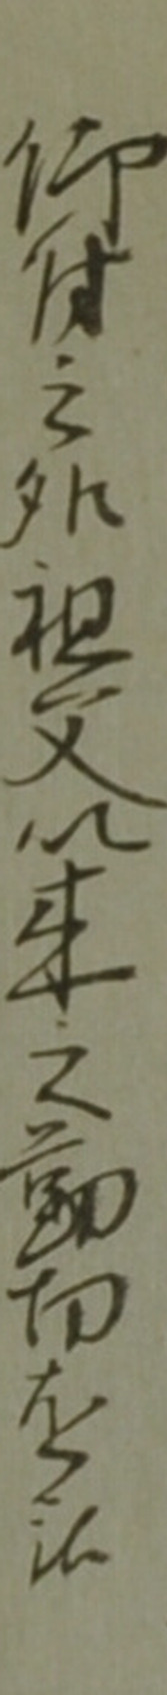仰付之処祖父以来之勤功を被
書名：諸御役代々録（八）
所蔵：伊那市立高遠町図書館・合同会社AMANE
